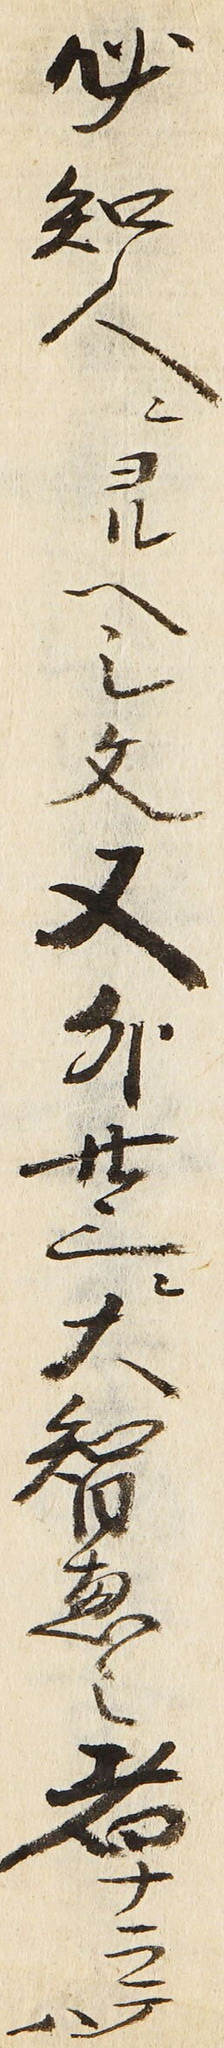必知人ニヨルヘシ文又外廿三に大智恵之者ナラテハ
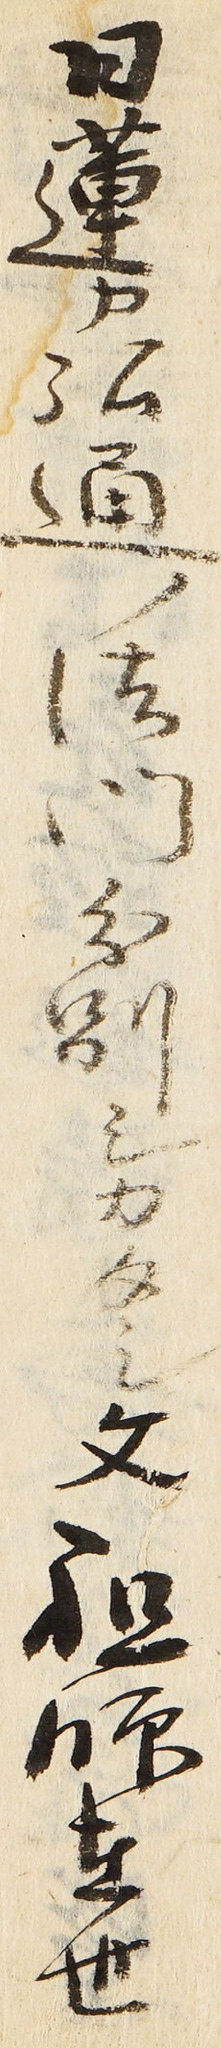日蓮カ弘通ノ法門分別シカタシ文祖師在世
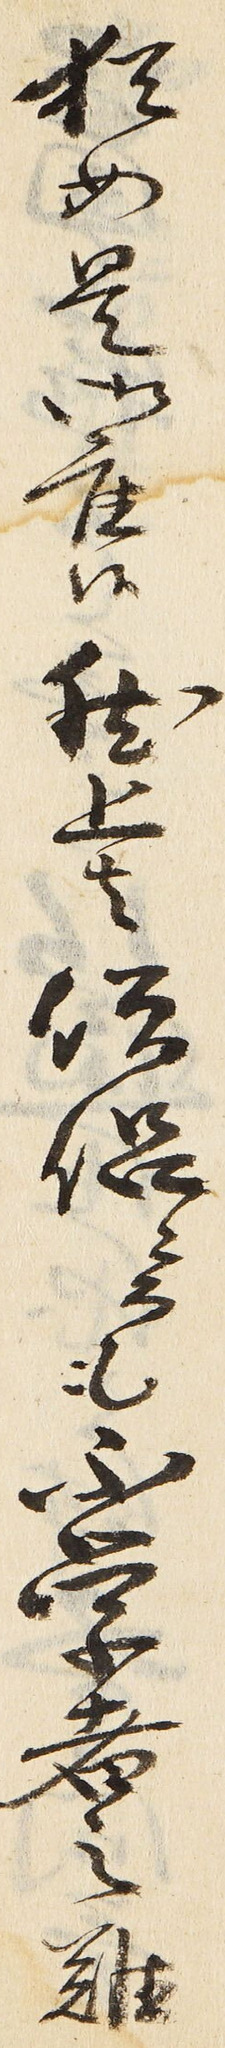猶如是御座候然上は僧侶にても不学者之難
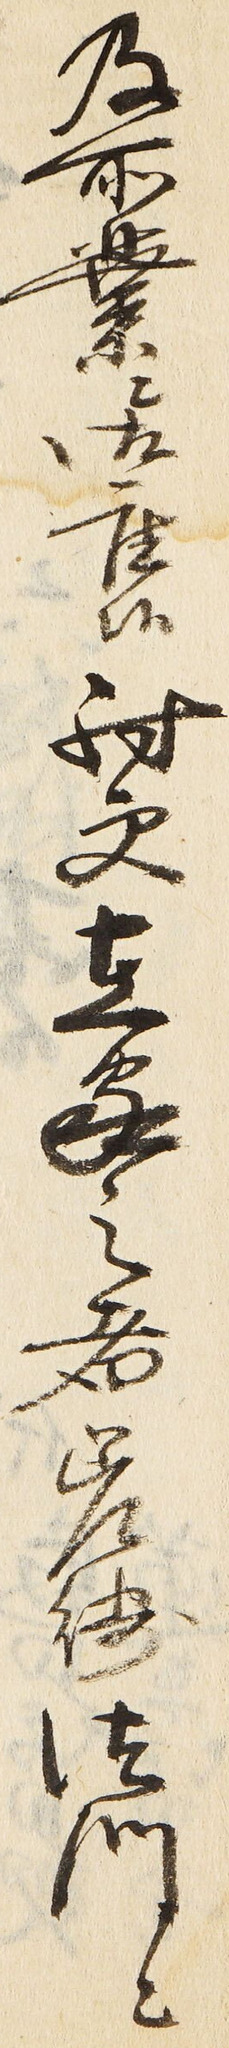及所業に御座候殊更在家之者差綺法門に
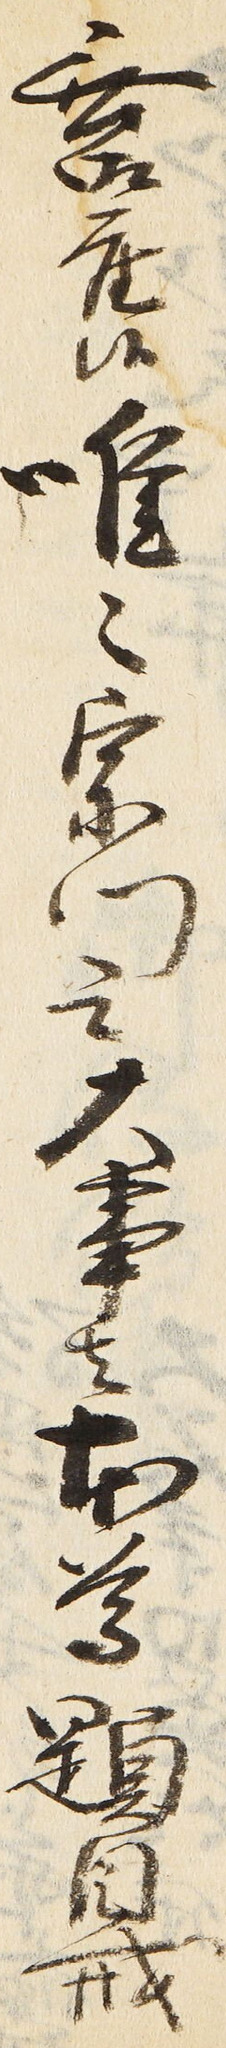無御座候唯々宗門之大事は本尊題目戒
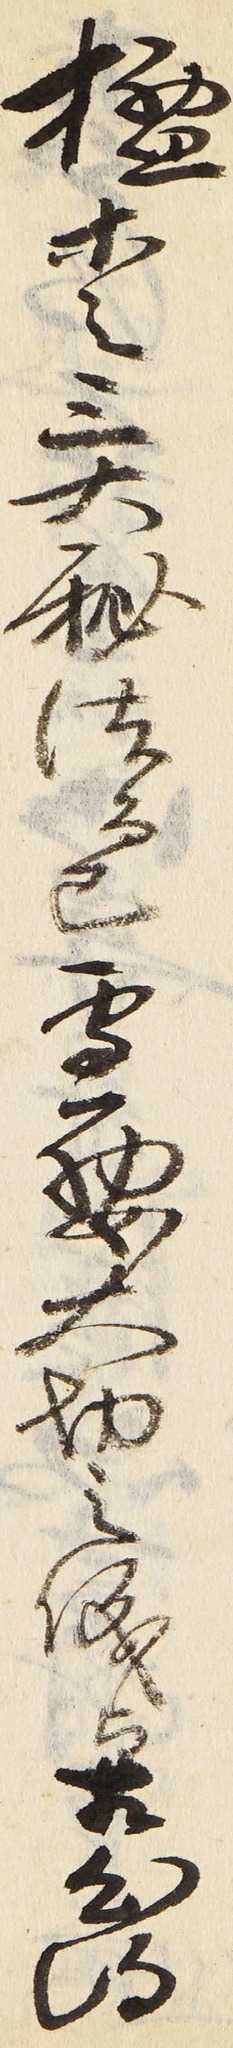檀等之三大秘法而己専要大切之儀と相心得
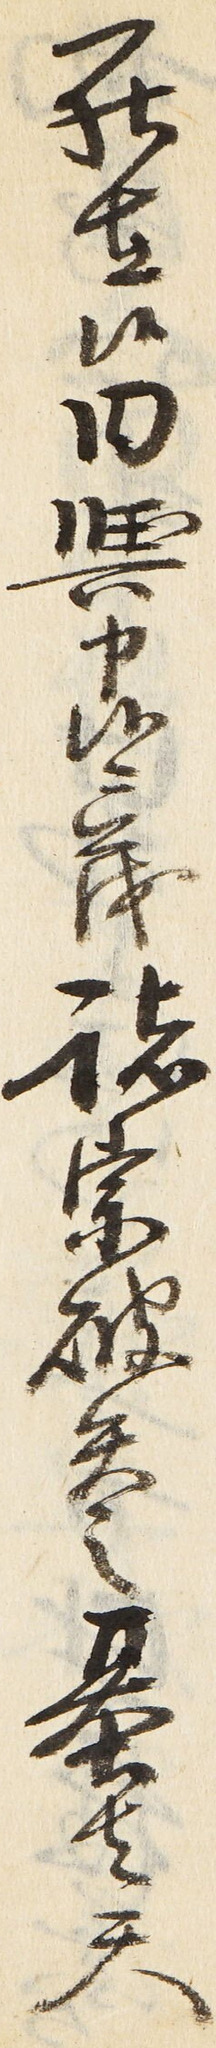罷在候日興申候にも諸宗破失之基は天
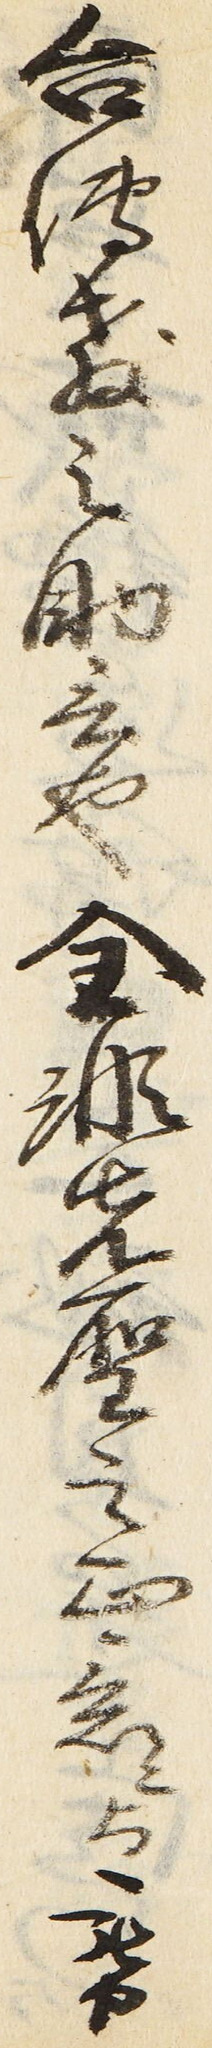台伝教之助言也全非先聖之正念にと被申
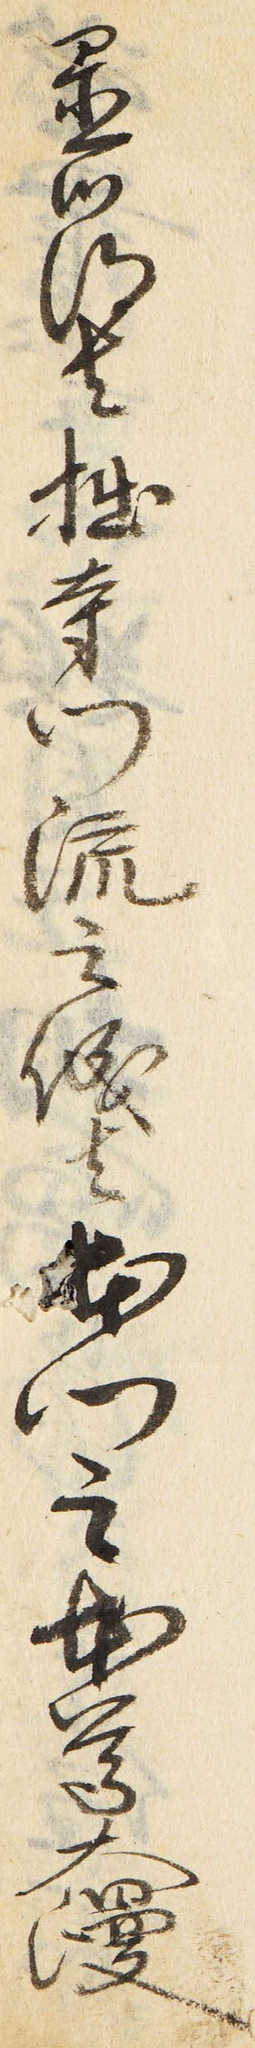置候得は拙寺門流之儀は本門之本尊大漫

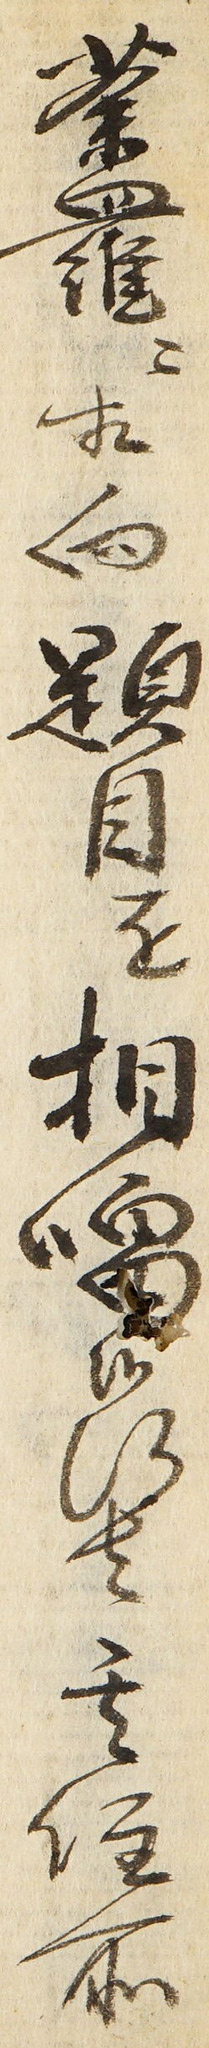荼羅に相向題目を相唱候得は其住所
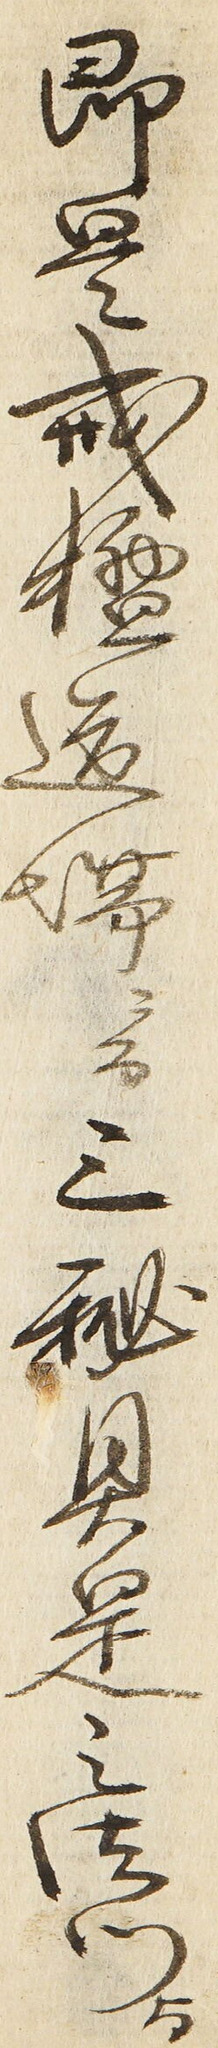即是戒壇道場にて三秘具是之法門と
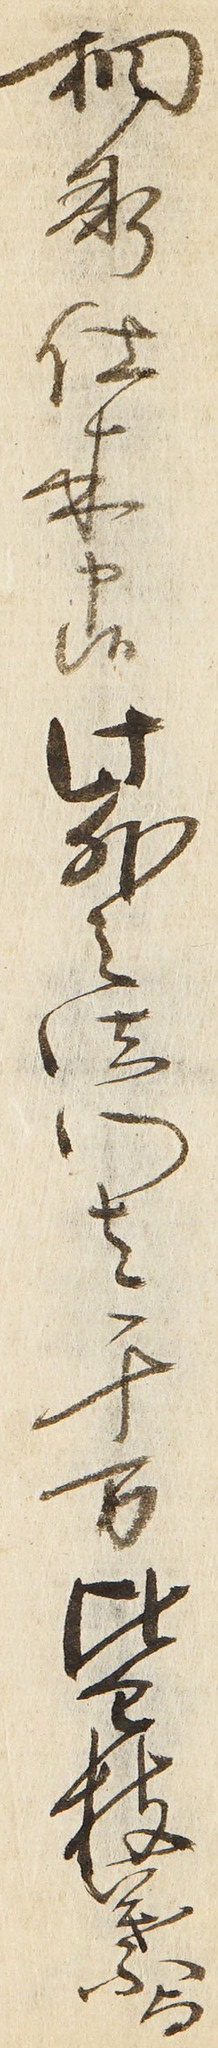相承仕来申候此外之法門は千万皆枝葉と
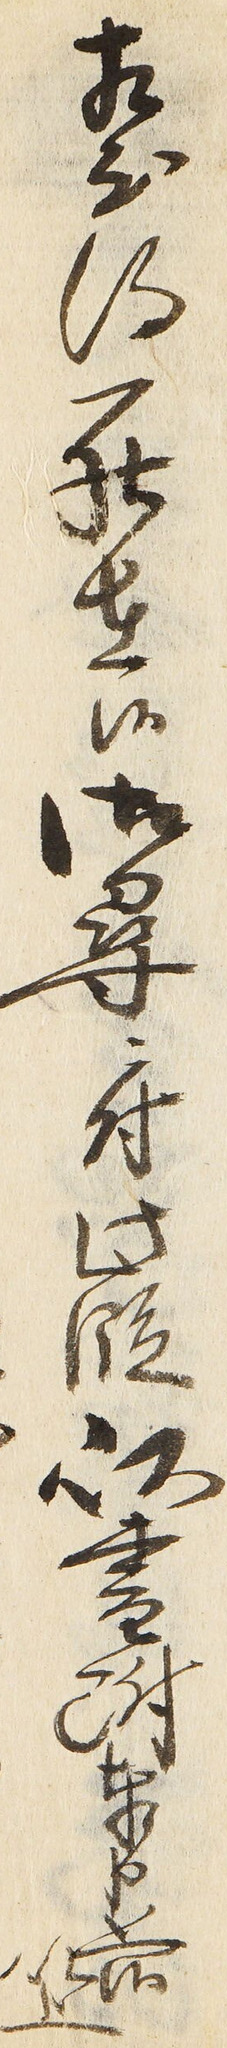相心得罷在候御尋に付此段以書附奉申上候
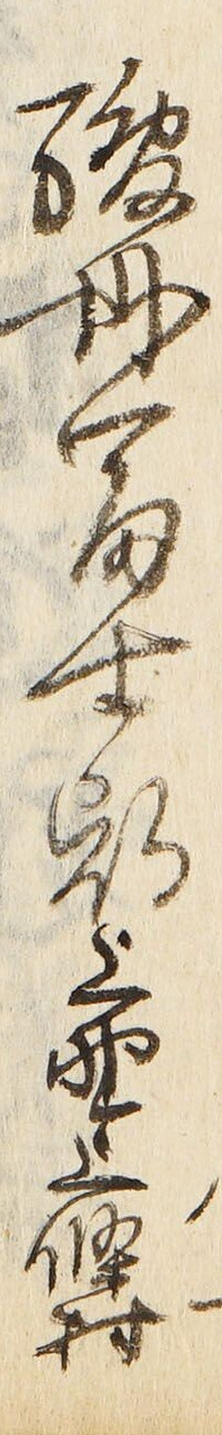駿州富士郡上野上條村
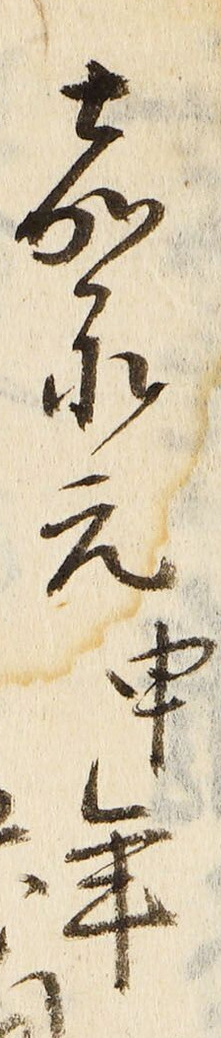嘉永元申年
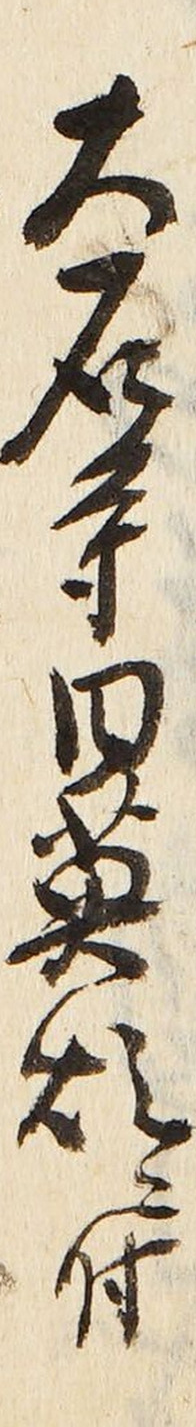大石寺日英煩に付
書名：異流一件日記
